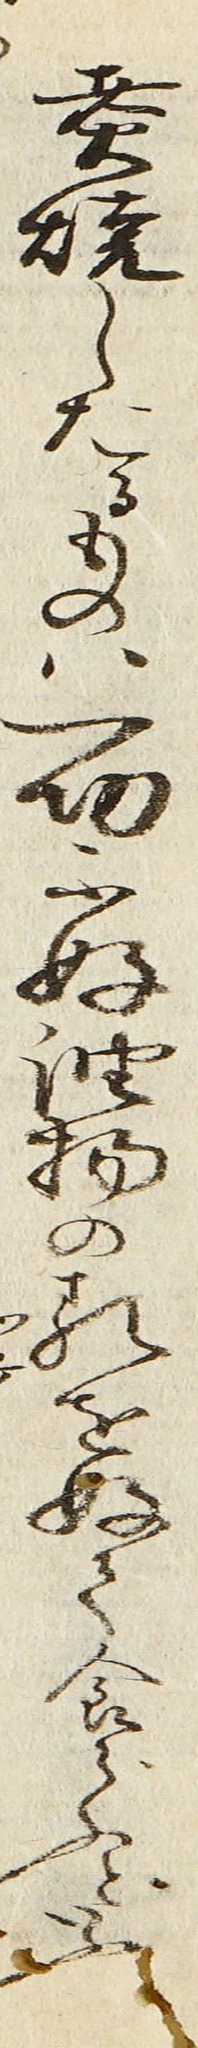煮焼したるものハ一切不好油揚の類を好て食らふといふ
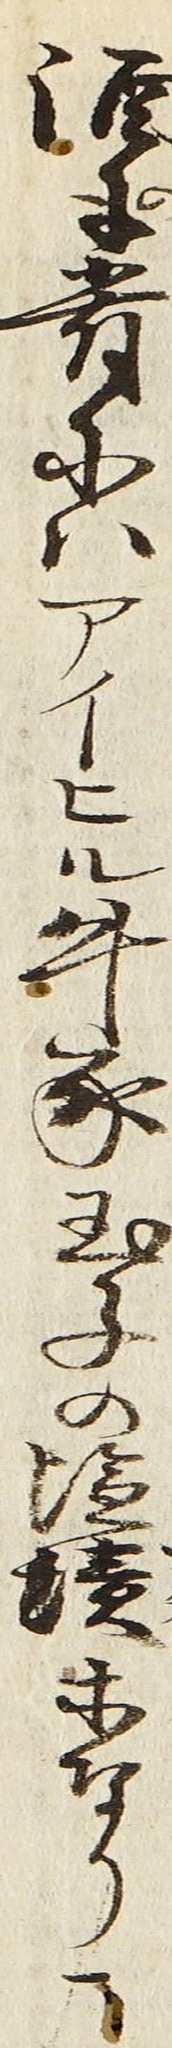酒の肴にハアイヒル牛豕玉子の塩漬等なり
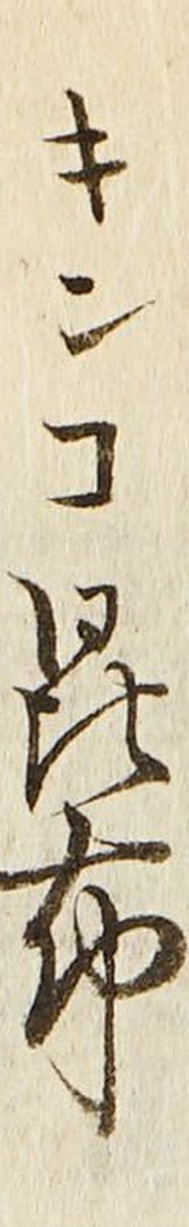キンコ昆布
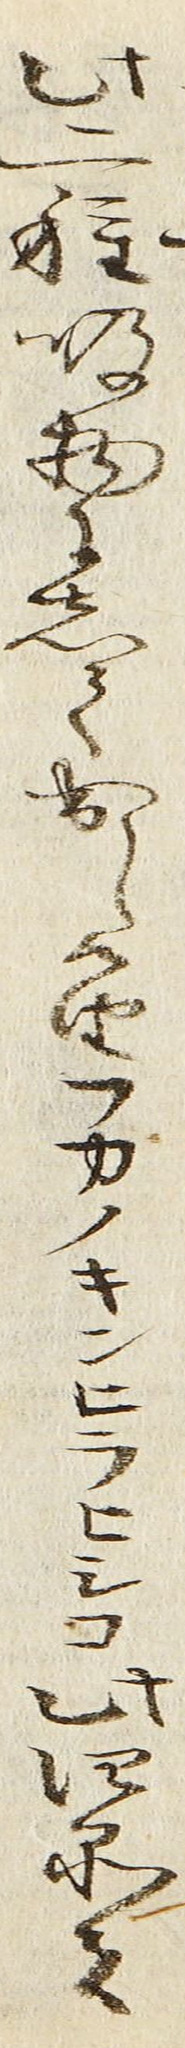此二種吸物にして出し候由フカノキンヒラヒシコ此四品は
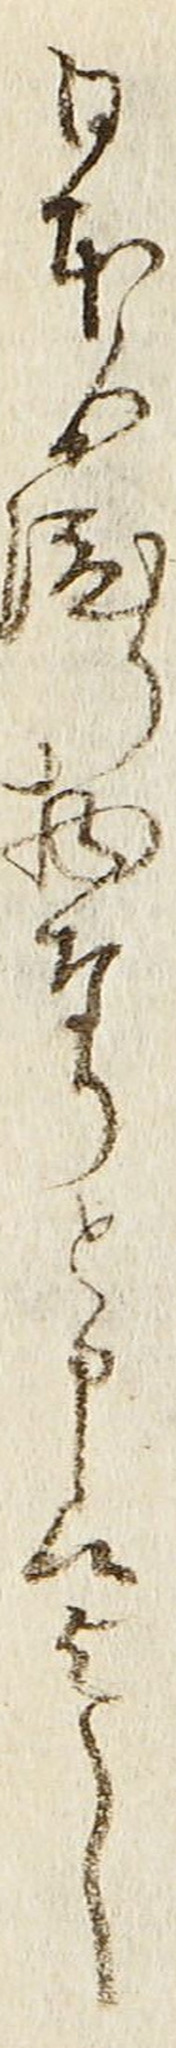日本ゟ渡り物なりと申候よし
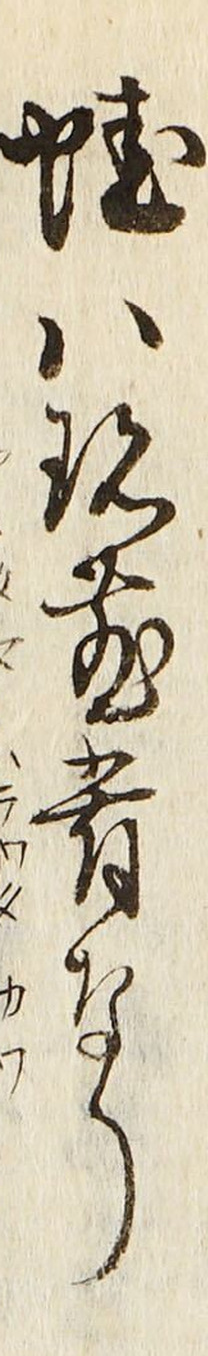蛙ハ珍敷肴なり
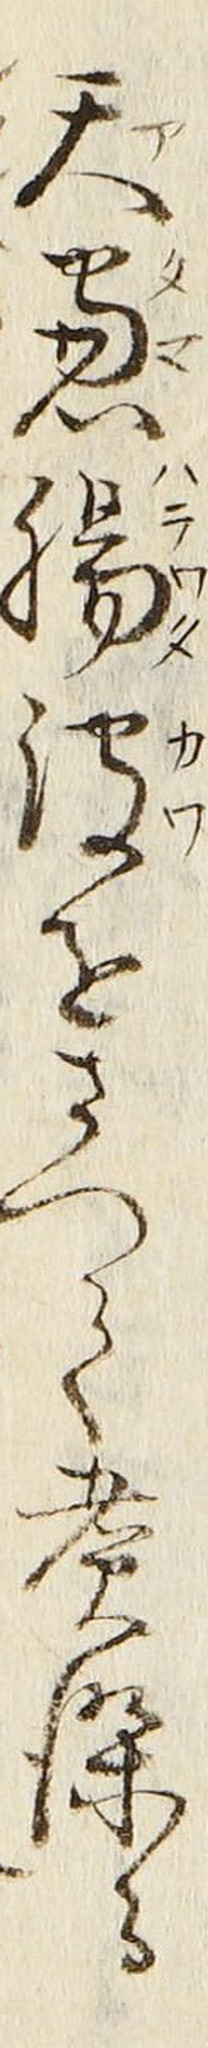天窓腸皮をさつて煮染る
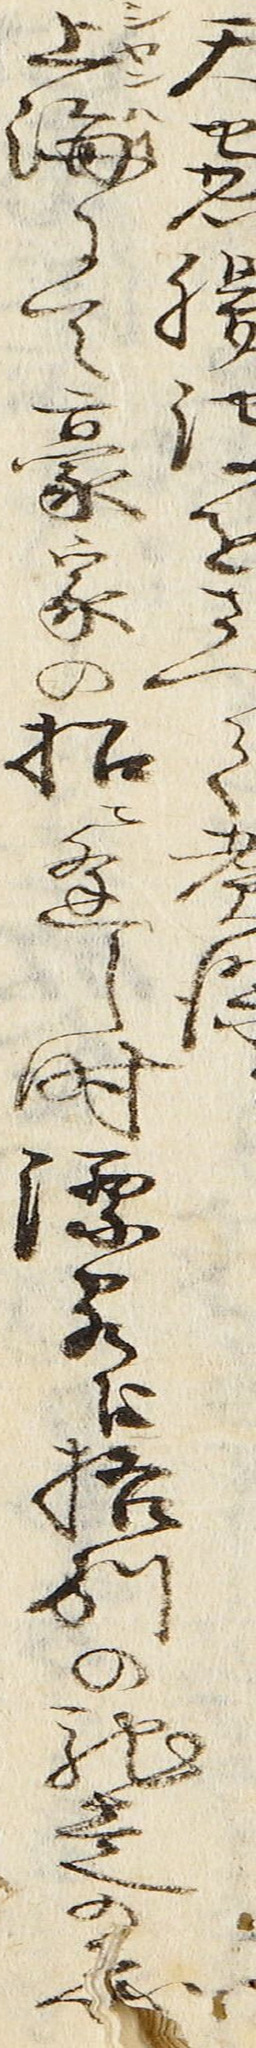上海にて豪家の招ニ逢し時漂客え格別の馳走の儀
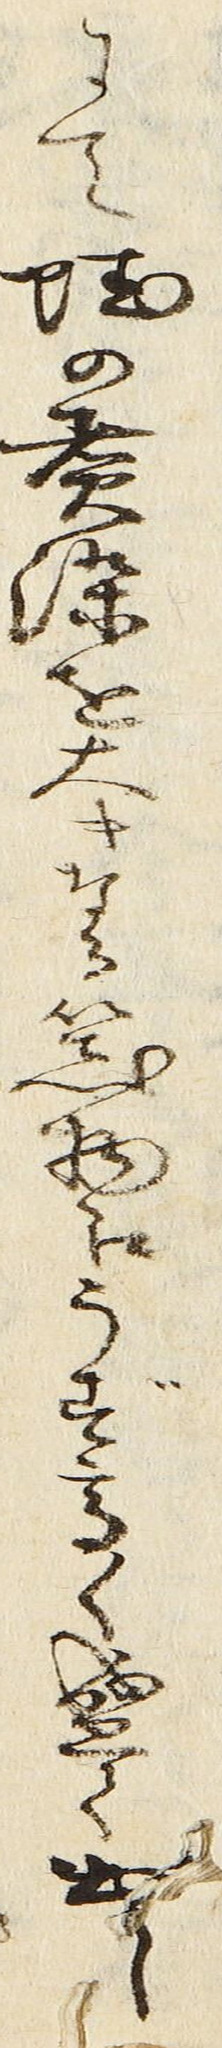にて蛙の煮染を大キなる器物えうず高く盛て出し
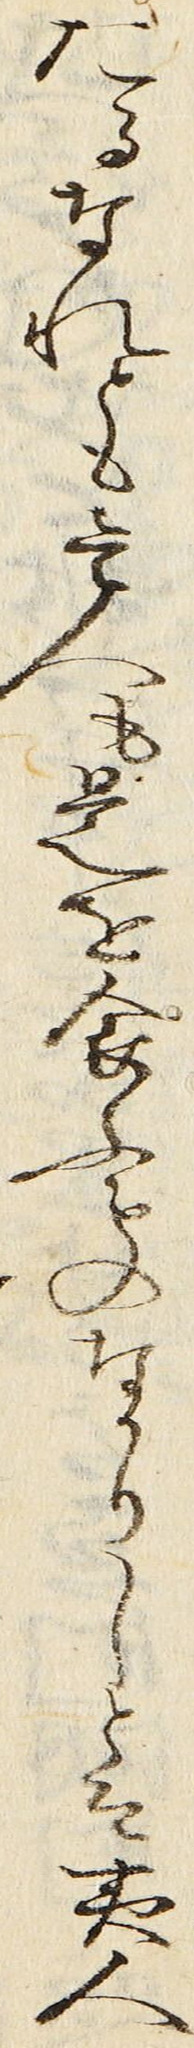たるなれとも壱人も是を食ふものなかりしとそ夷人
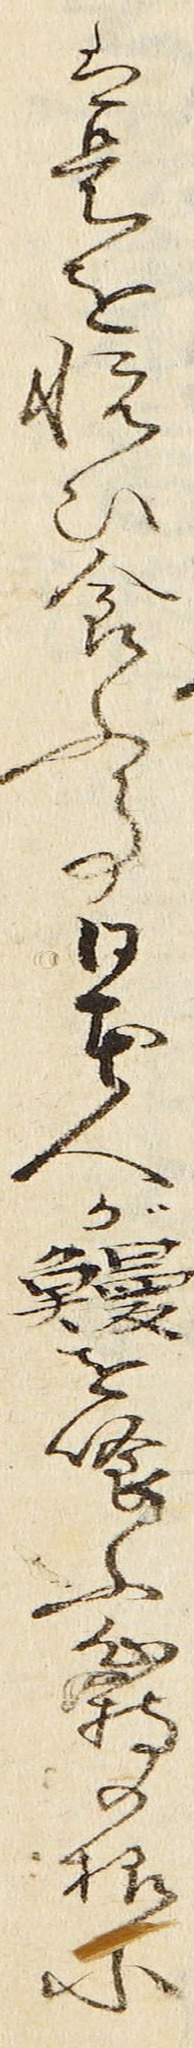は是を悦ひ食ふ事日本人が鰻を喰ふ心持の様に
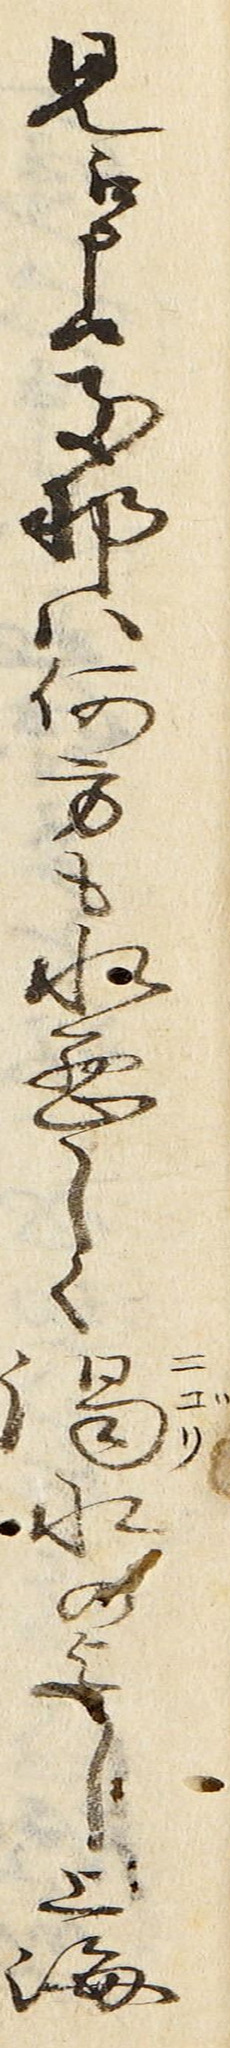見え申候支那ハ何方も水悪しく濁水のよし上海
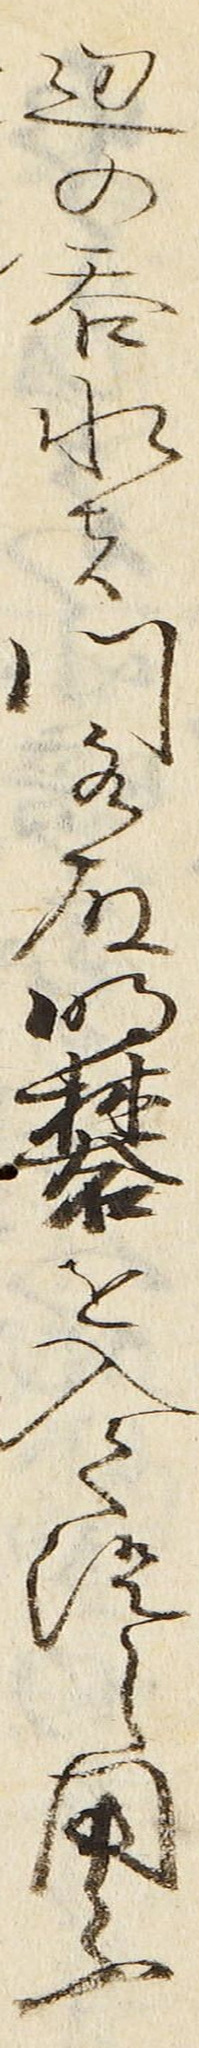辺の呑水は川水故明礬を入て澄し用ふ
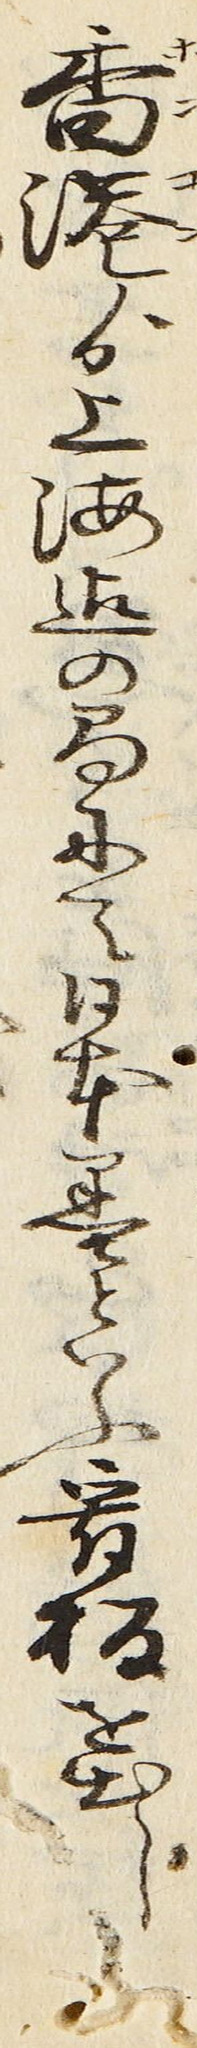香港ゟ上海迄の間にて日本墨といふ看板を出し
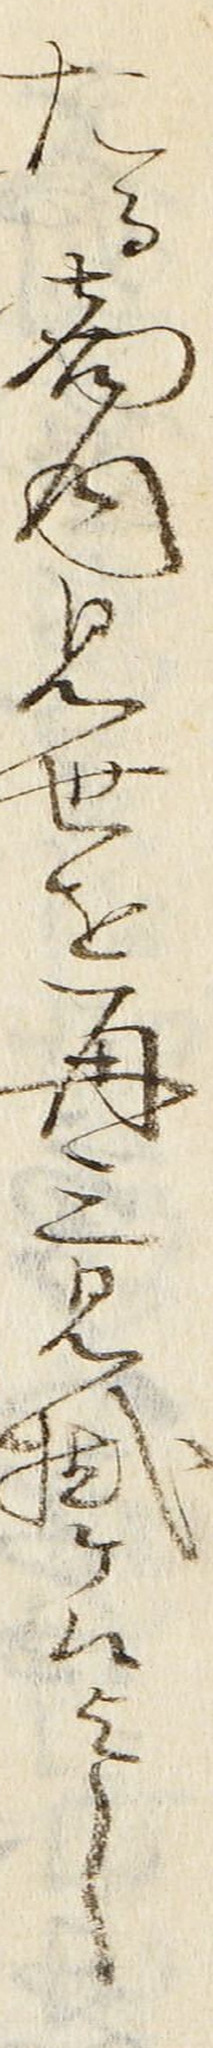たる商内見世を再三見掛ケ候よし
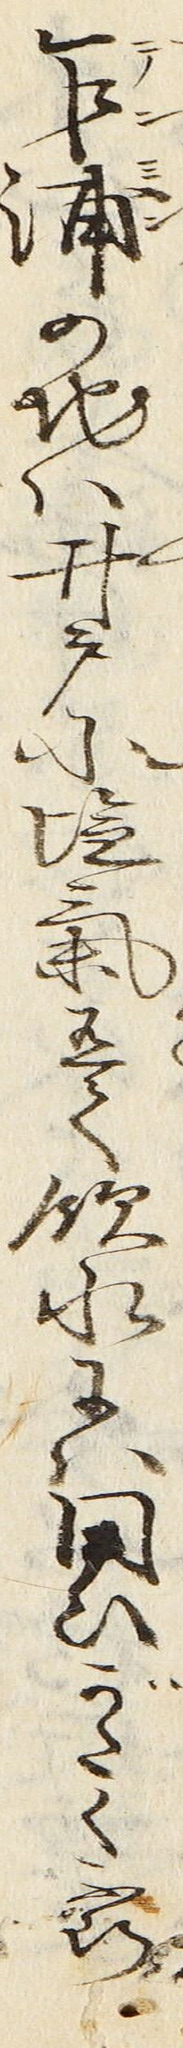乍浦の地ハ井戸に塩気有て飲水にハ用ひがたく不断
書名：亜墨利加漂流記聞
